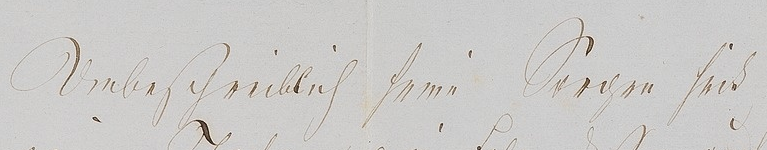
Unbeschreiblich seine Sorgen seit
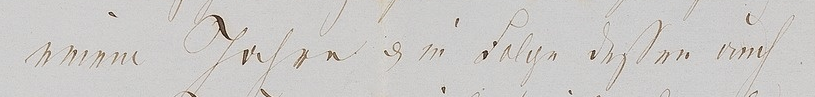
einem Jahre & in Folge dessen auch
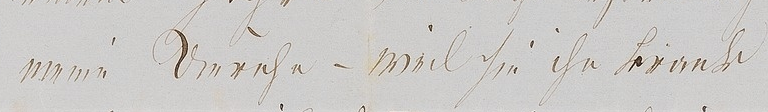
meine Unruhe – weil sie ihn krank
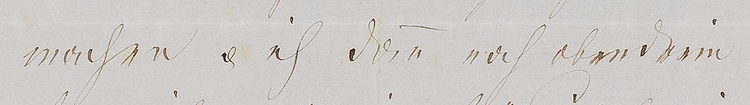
machen & ich dann noch obendrein
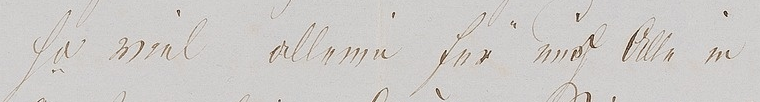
so viel alleine für uns Alle in
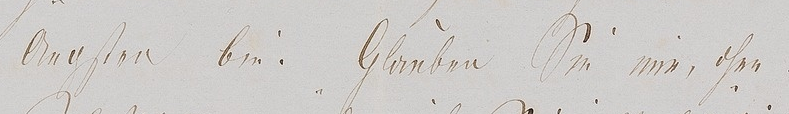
Ängsten bin. Glauben Sie mir, ohne
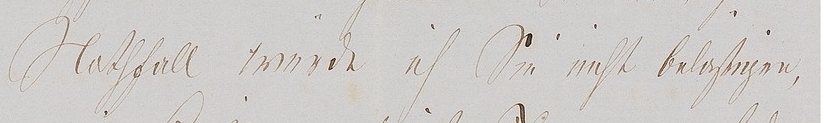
Nothfall würde ich Sie nicht belästigen,
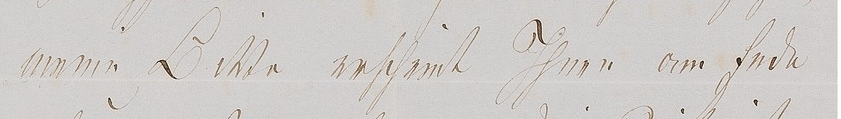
meine Bitte erscheint Ihnen am Ende
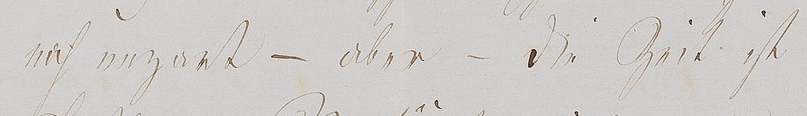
noch unzart – aber – die Zeit ist
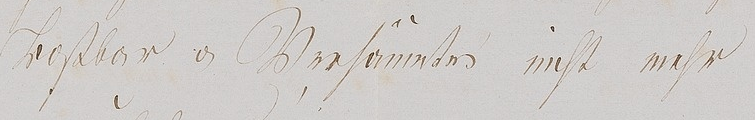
kostbar & Versäumtes nicht mehr
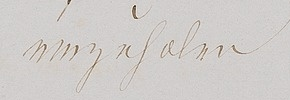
einzuholen!
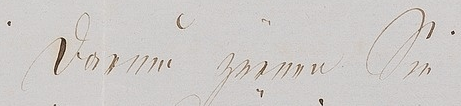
Darum zürnen Sie
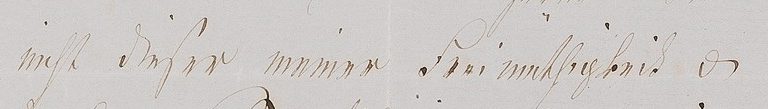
nicht dieser meiner Freimüthigkeit &
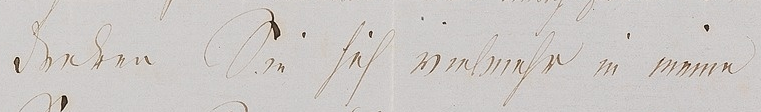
denken Sie sich vielmehr in meine
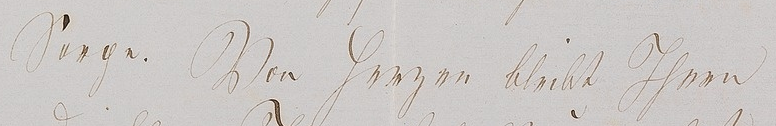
Sorge. Von Herzen bleibt Ihnen
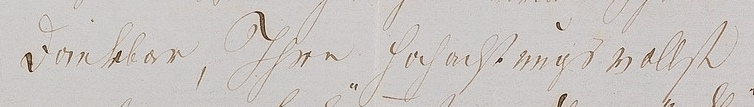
dankbar, Ihre hochachtungsvollst
